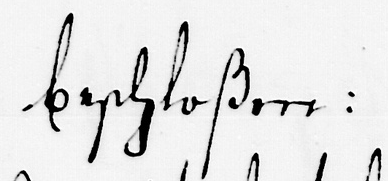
beschloßen:
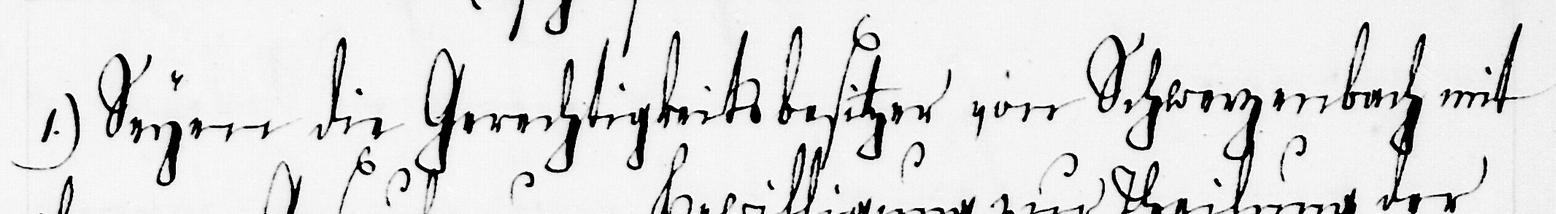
1.) Seyen die Gerechtigkeitsbesitzer von Schwerzenbach mit
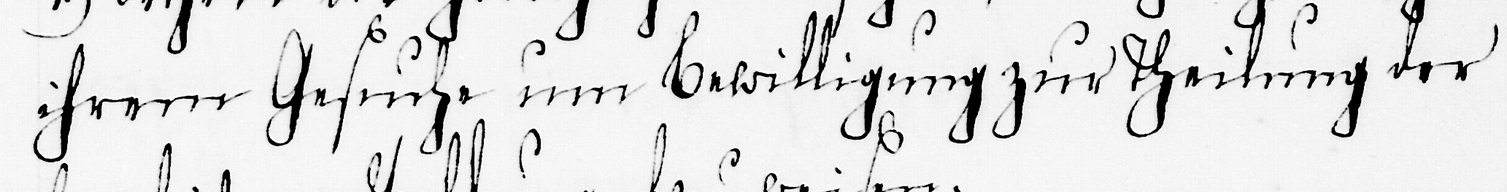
ihrem Gesuche um Bewilligung zur Theilung der
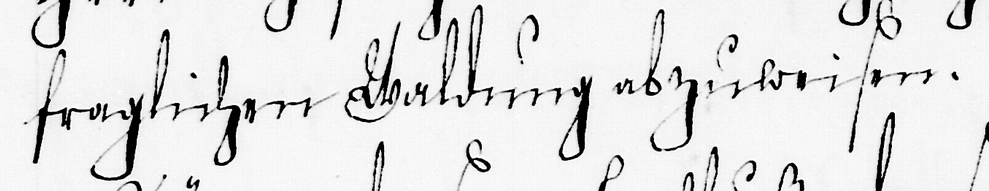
fraglichen Waldung abzuweisen.
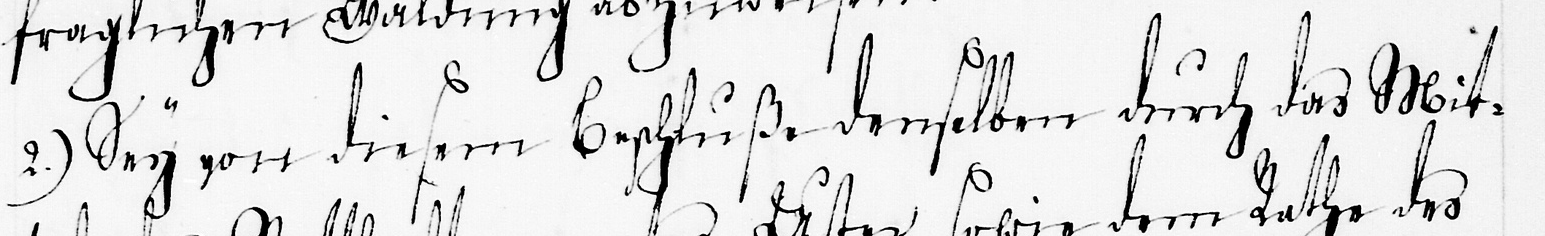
2.) Sey von diesem Beschluße denselben durch das Mit¬
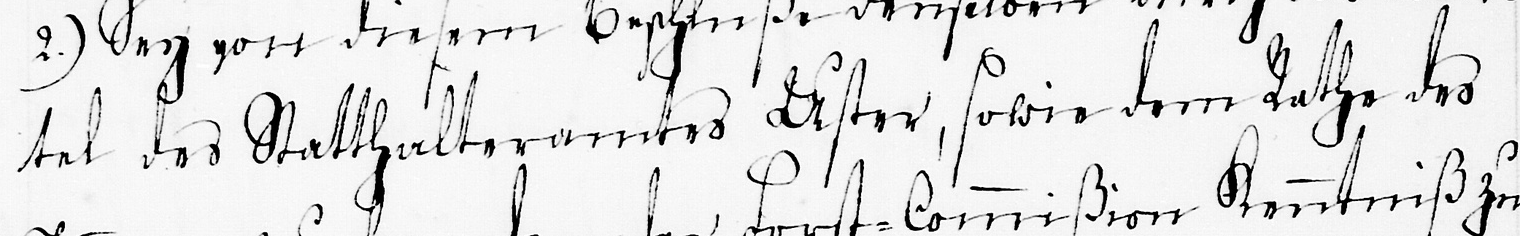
tel des Statthalteramtes Uster, sowie dem Rathe des
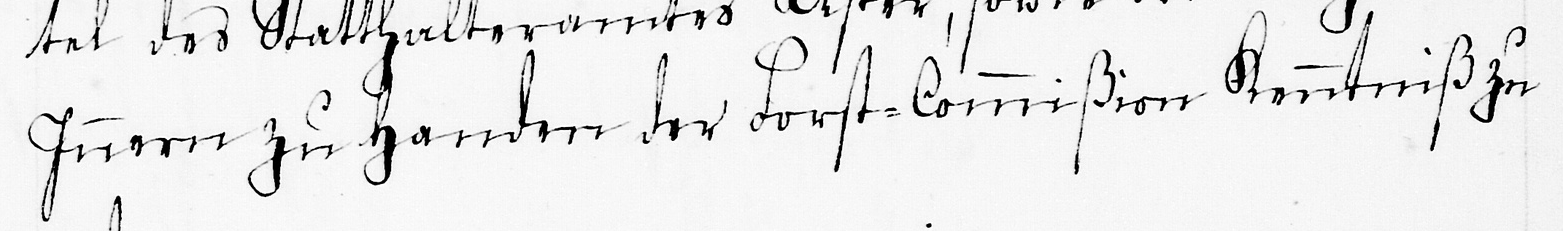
Innern zu Handen der Forst-Commißion Kenntniß zu
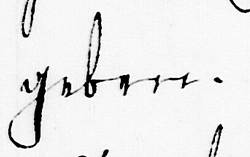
geben.
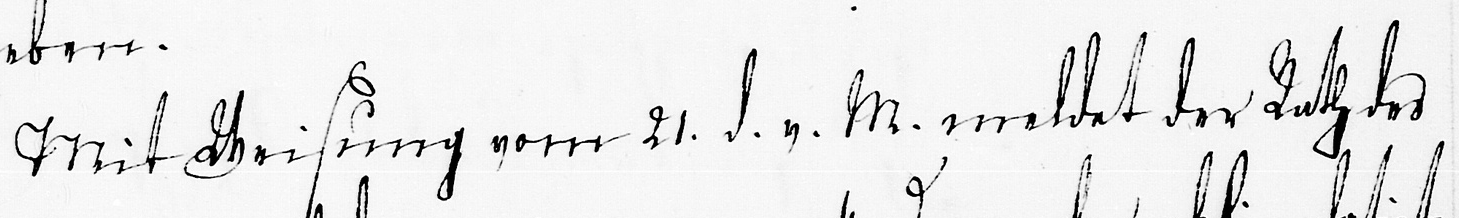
Mit Weisung vom 21. d. v. M. meldet der Rath des
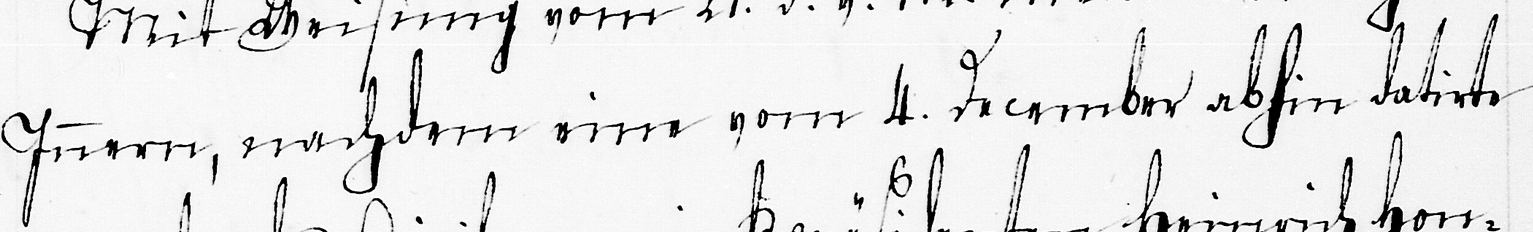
Innern, nachdem eine vom 4. December abhin datirte
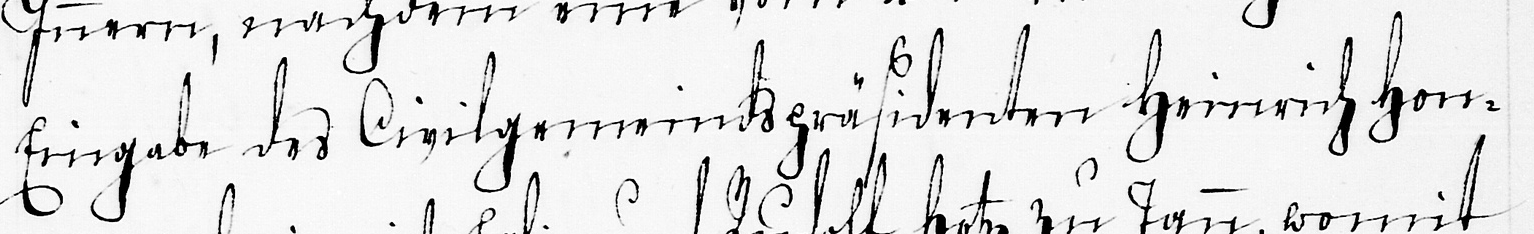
Eingabe des Civilgemeindspräsidenten Heinrich Hon¬
